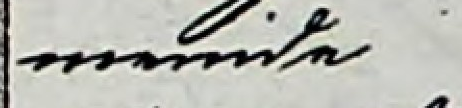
meinde
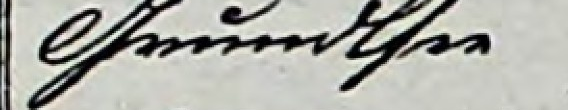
Grundlser
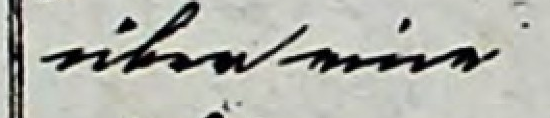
über eine
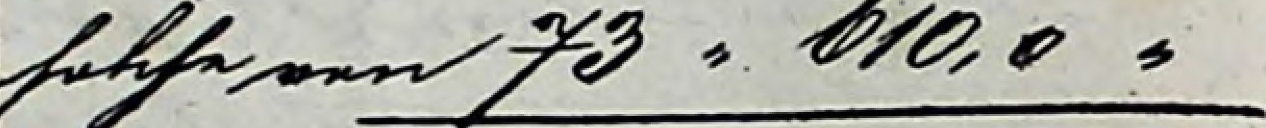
holche von 73 „ 610,0 „
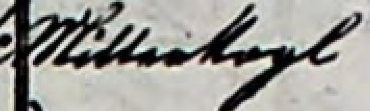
Mitterkogl
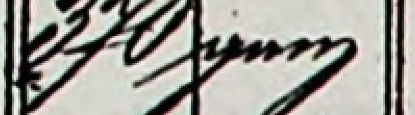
370 ganz
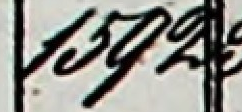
1592
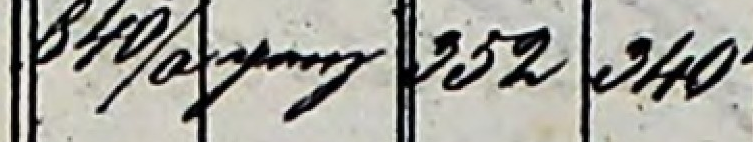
840/a ganz 352 340
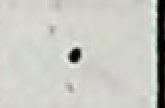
.
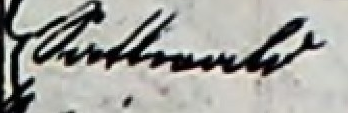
Sattwald
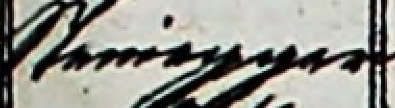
Steinegger„
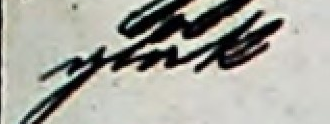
glak
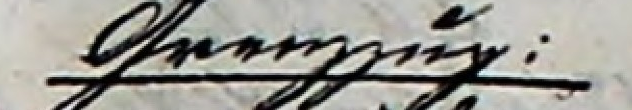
Grenzzug:
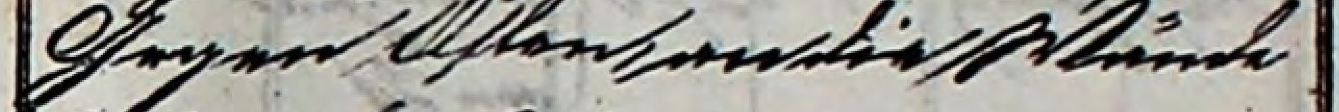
Gegen Osten, an die Wände
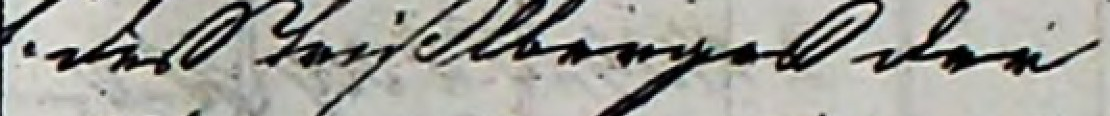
des Teißlberges der
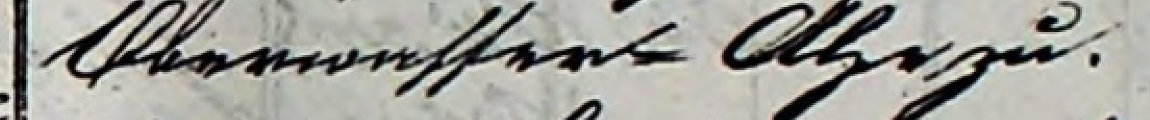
Uberwasser= Atze zu
